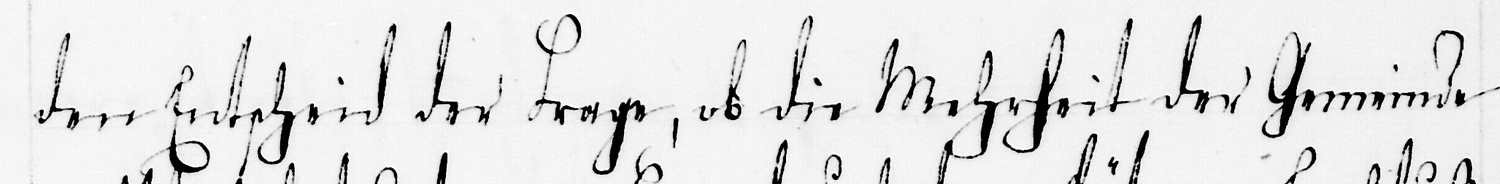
den Entscheid der Frage, ob die Mehrheit der Gemeinde
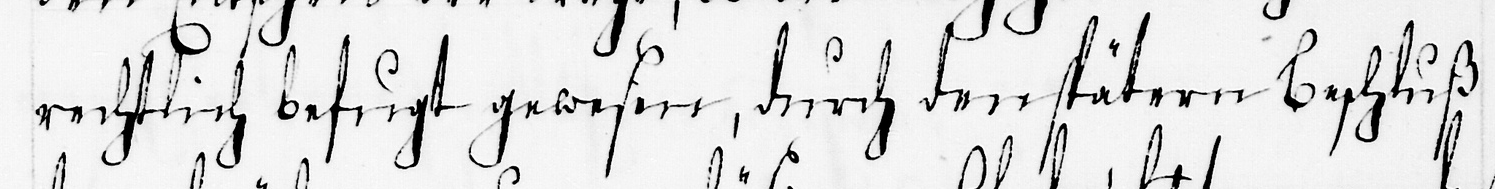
rechtlich befugt gewesen, durch den spätern Beschluß
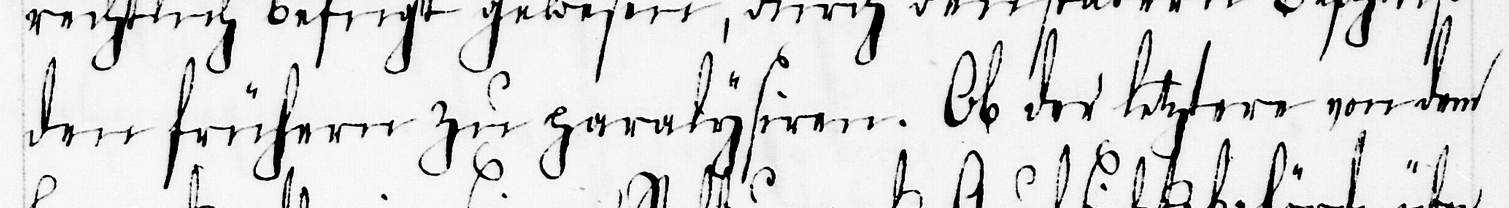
den frühern zu paralysiren. Ob der letztere von dem
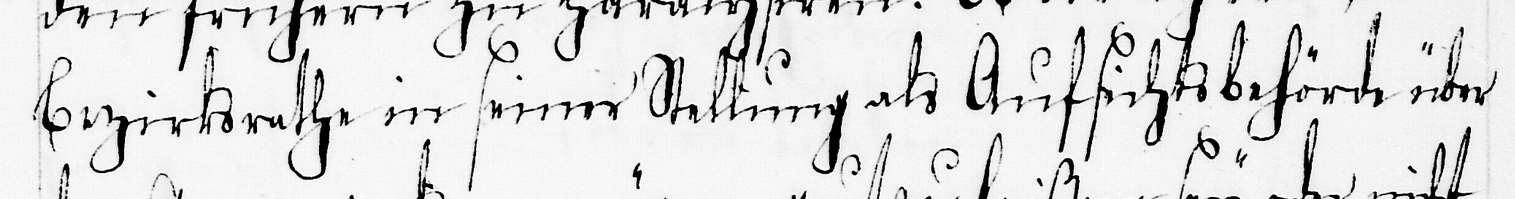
Bezirksrathe in seiner Stellung als Aufsichtsbehörde über
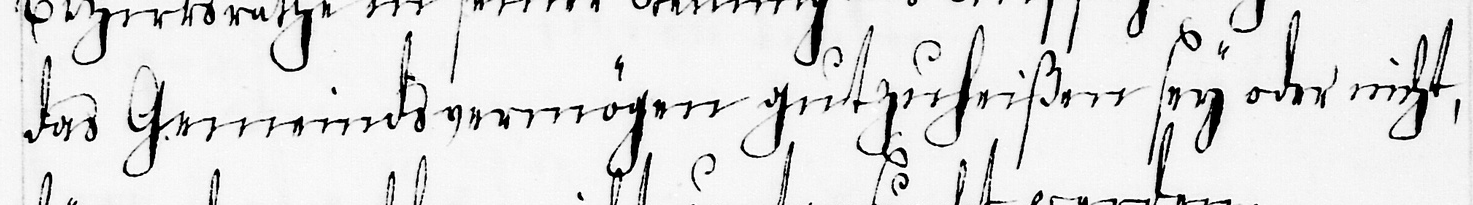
das Gemeindsvermögen gutzuheißen sey oder nicht,
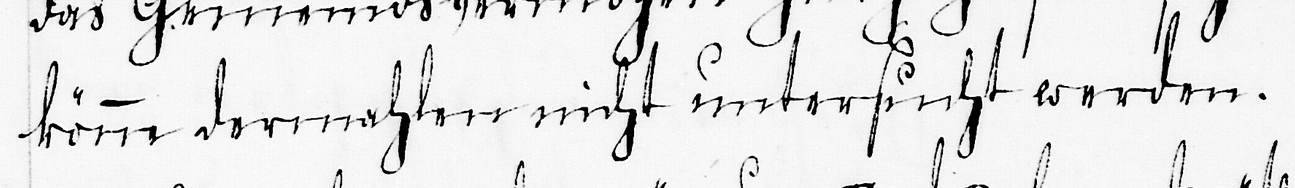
könne dermahlen nicht untersucht werden.
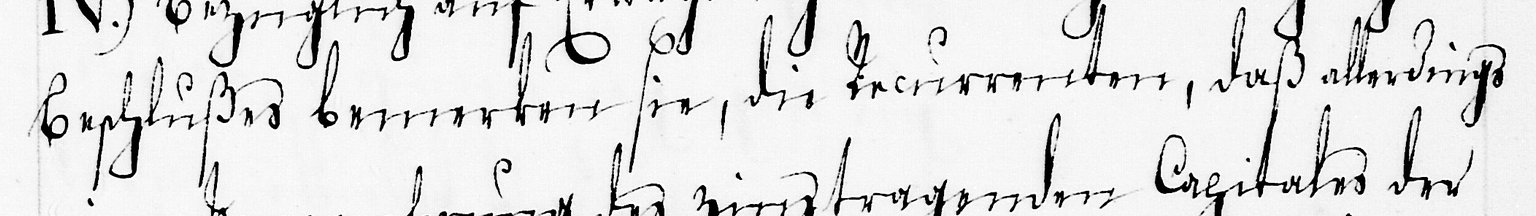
Beschlußes bemerken sie, die Recurrenten, daß allerdings
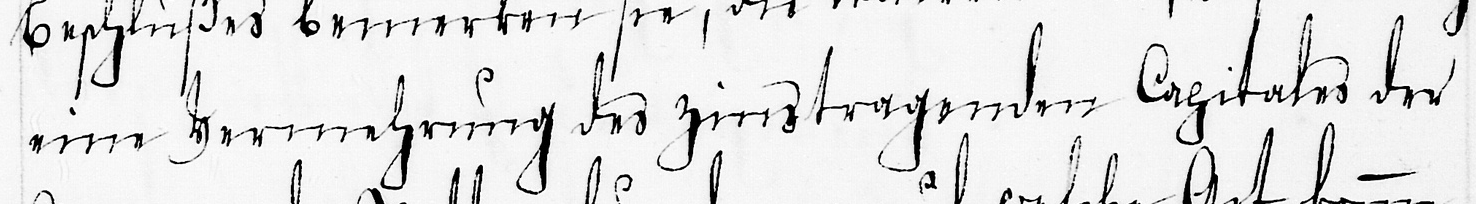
eine Vermehrung des zinstragenden Capitales der
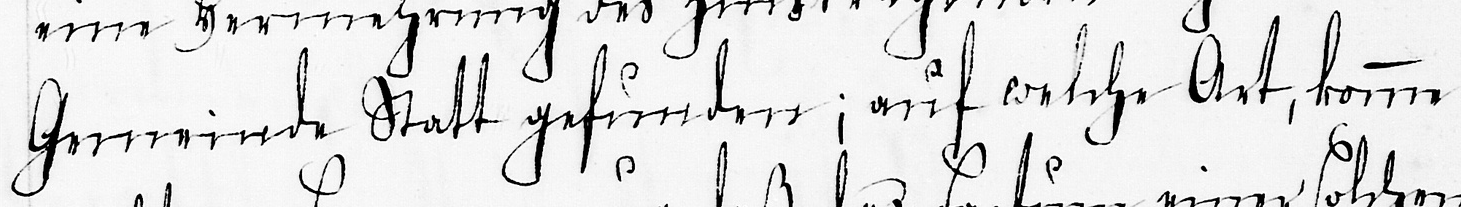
Gemeinde Statt gefunden; auf welche Art, komme
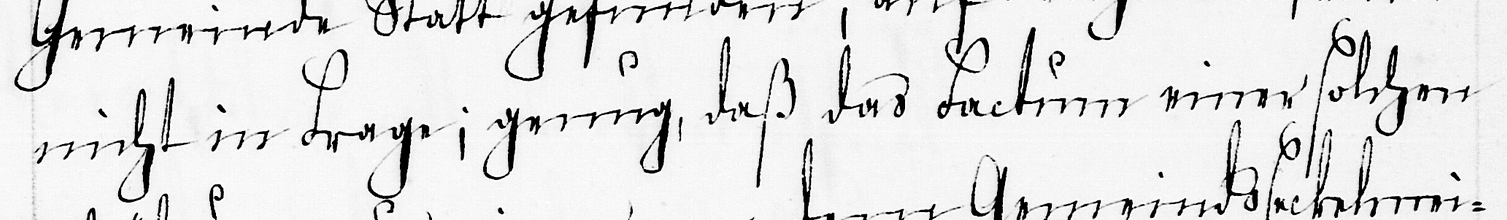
nicht in Frage; genug, daß das Factum einer solchen
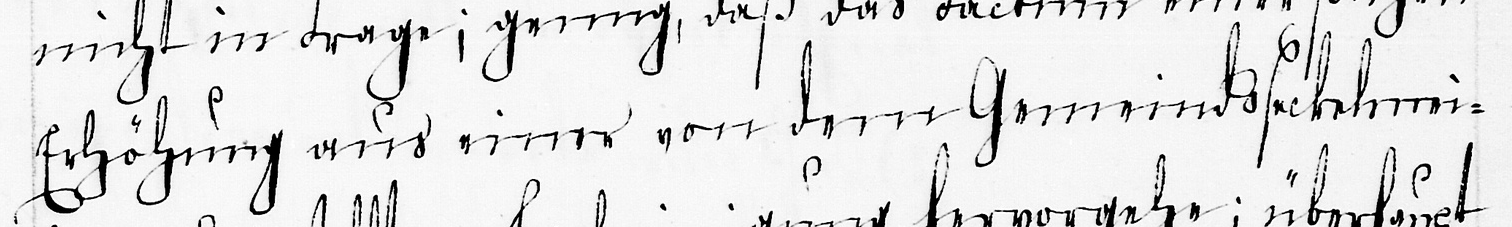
Erhöhung aus einer von dem Gemeindsseckelmei¬
